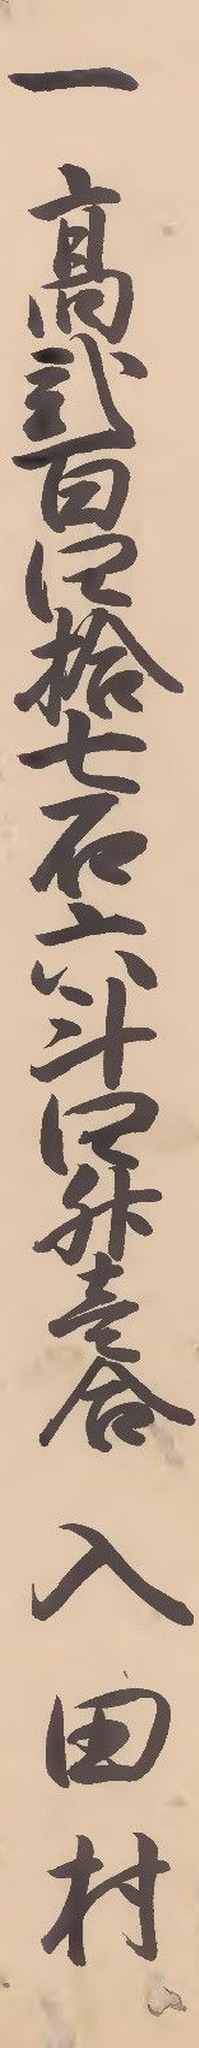一高弐百四拾七石六斗四升壱合入田村
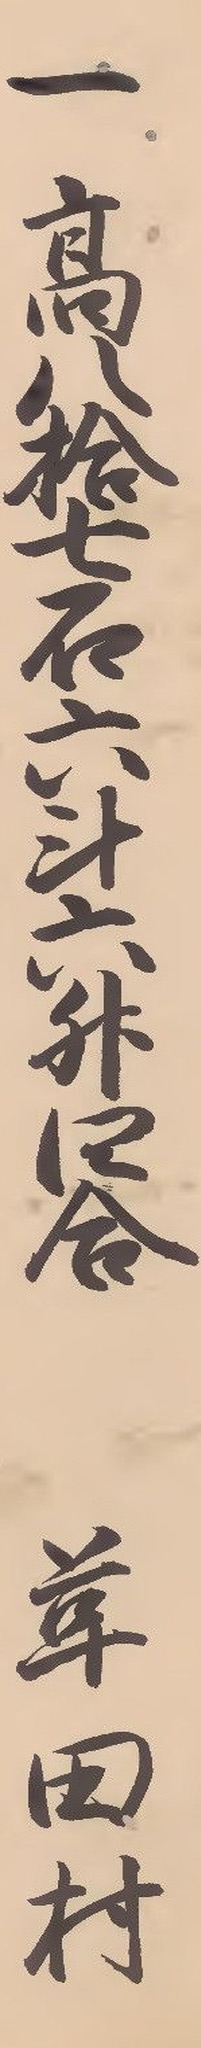一高八拾七石六斗六升四合草田村
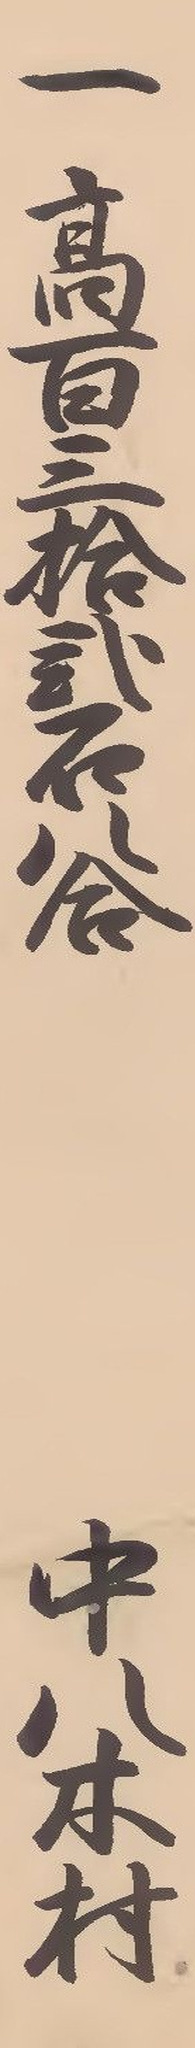一高百三拾弐石八合中八木村
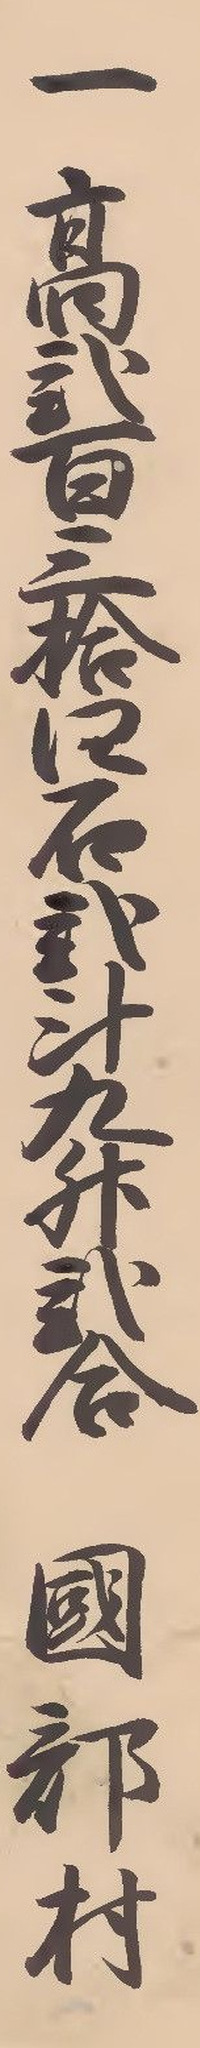一高弐百三拾四石弐斗九升弐合国部村
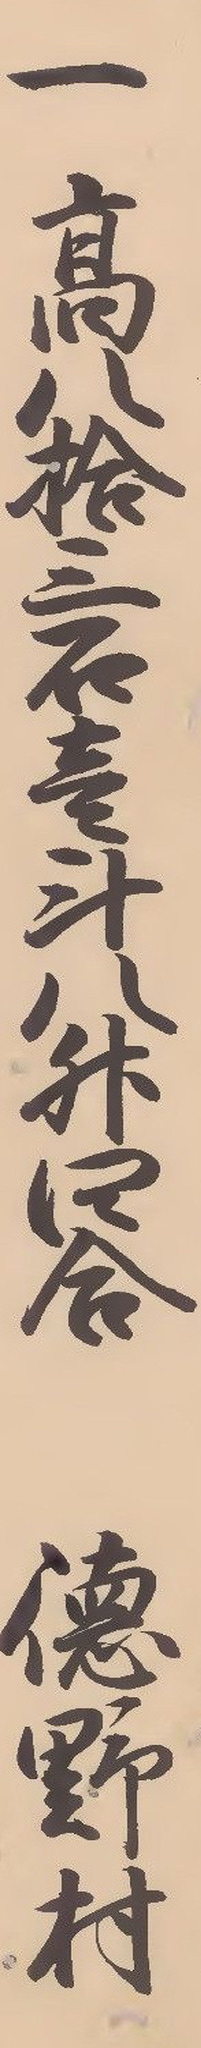一高八拾三石壱斗八升四合徳野村
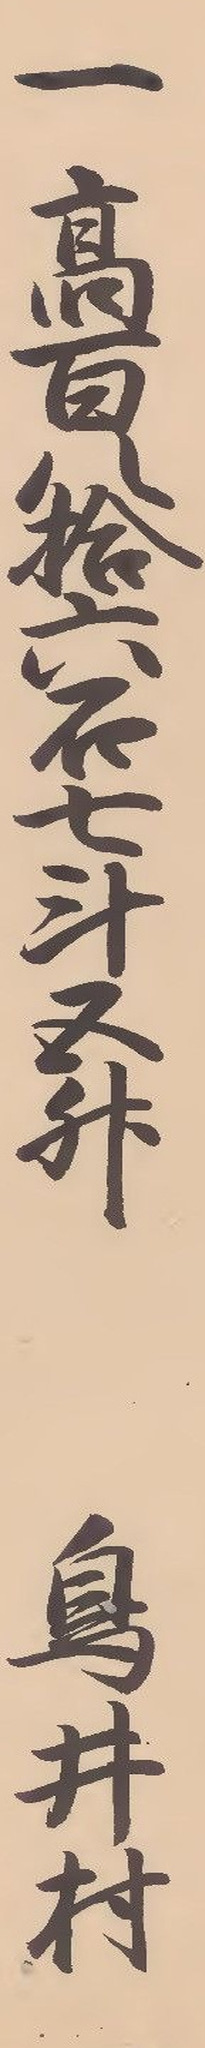一高百八拾六石七斗五升鳥井村
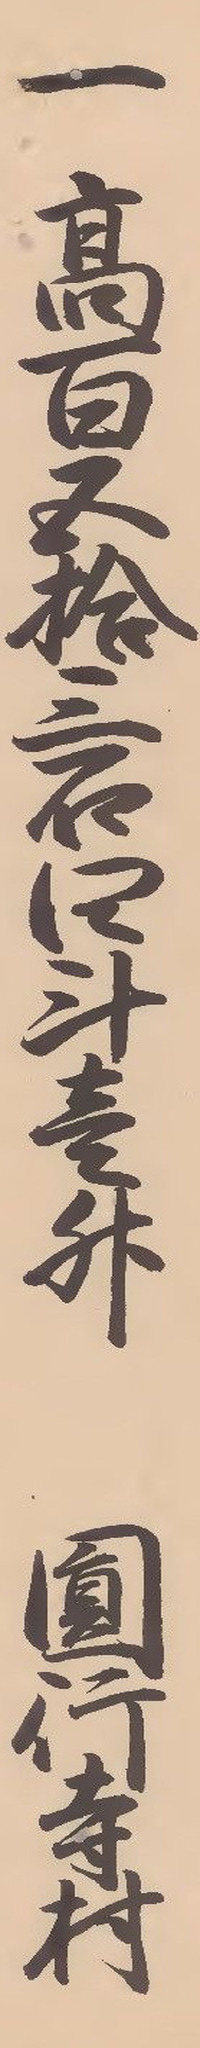一高百五拾三石四斗壱升円行寺村
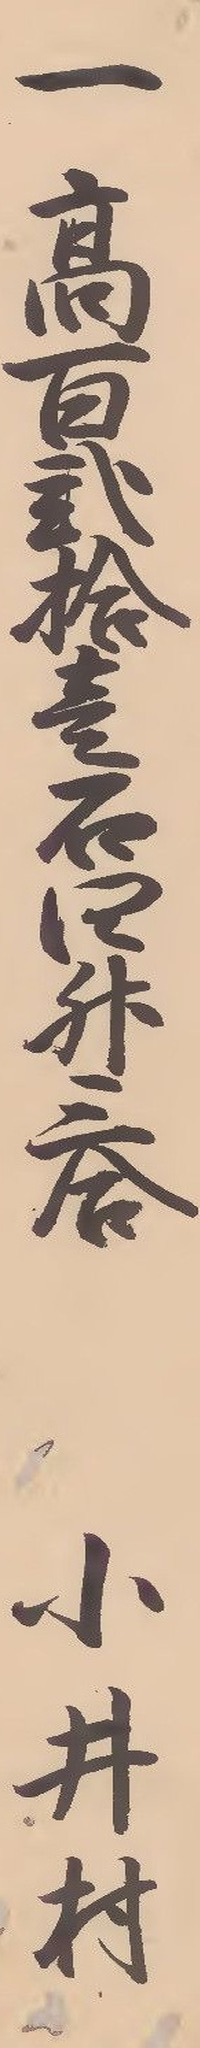一高百弐拾壱石四升三合小井村

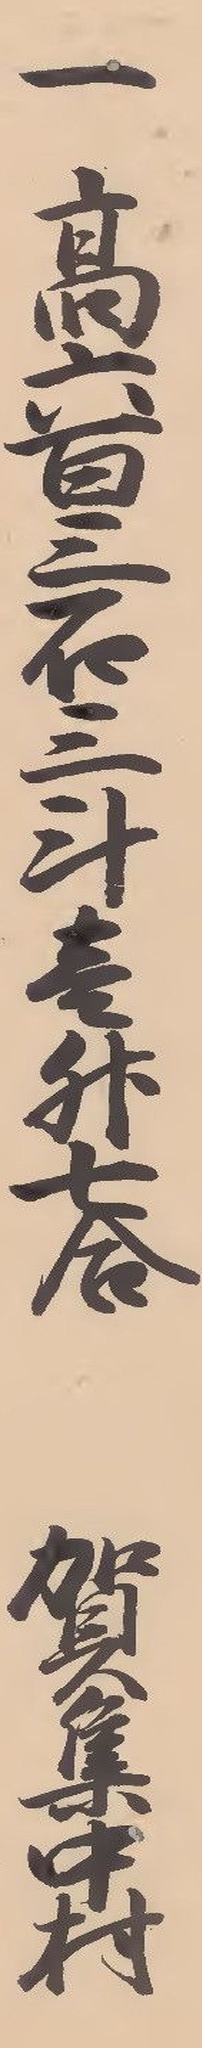一高六百三石三斗壱升七合賀集中村
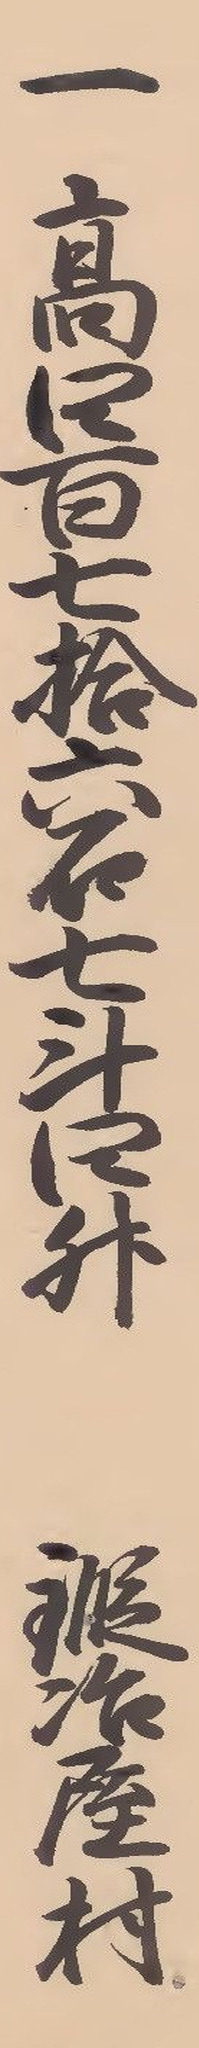一高四百七拾六石七斗四升鍛冶屋村
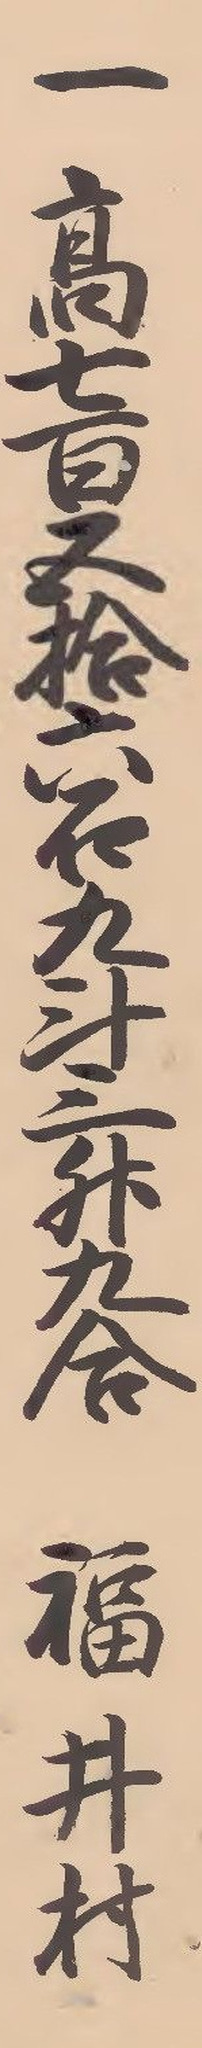一高七百五拾六石九斗三升九合福井村
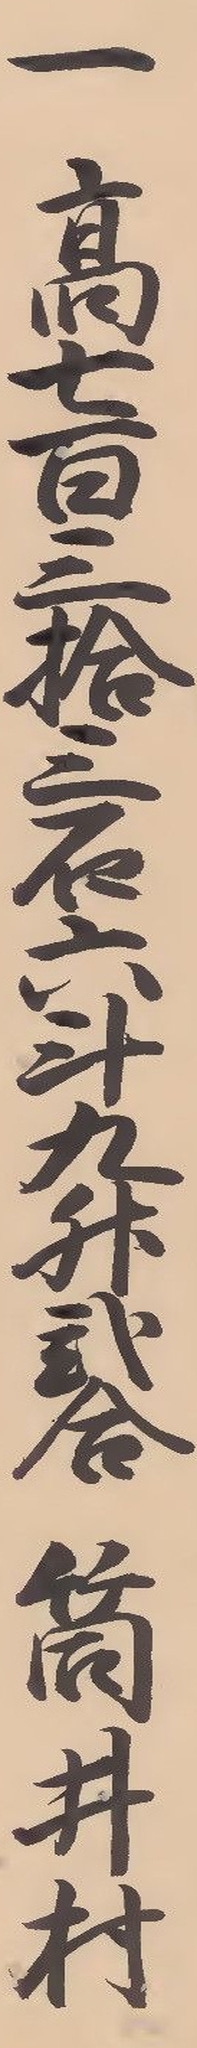一高七百三拾三石六斗九升弐合筒井村
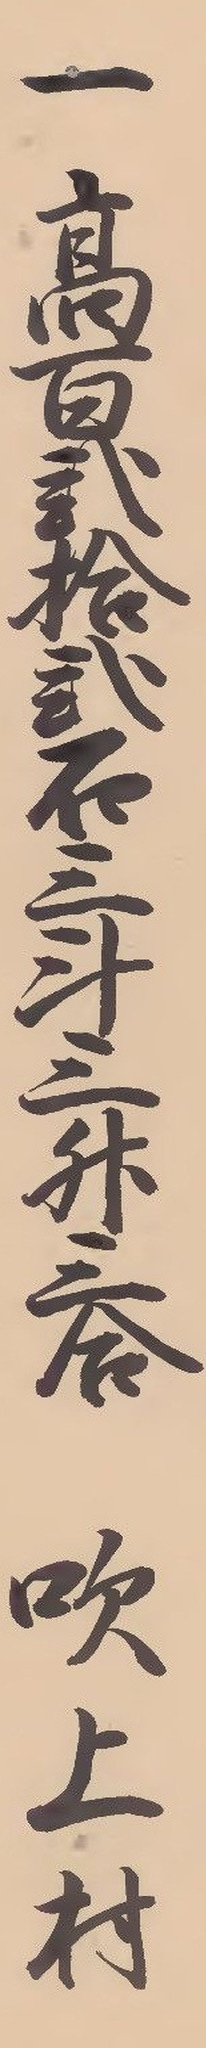一高百弐拾弐石三斗三升三合吹上村
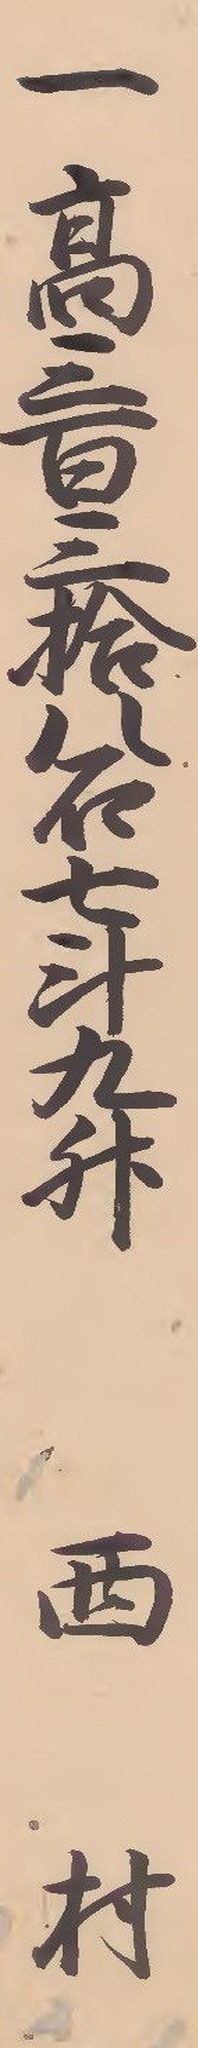一高三百三拾八石七斗九升西村

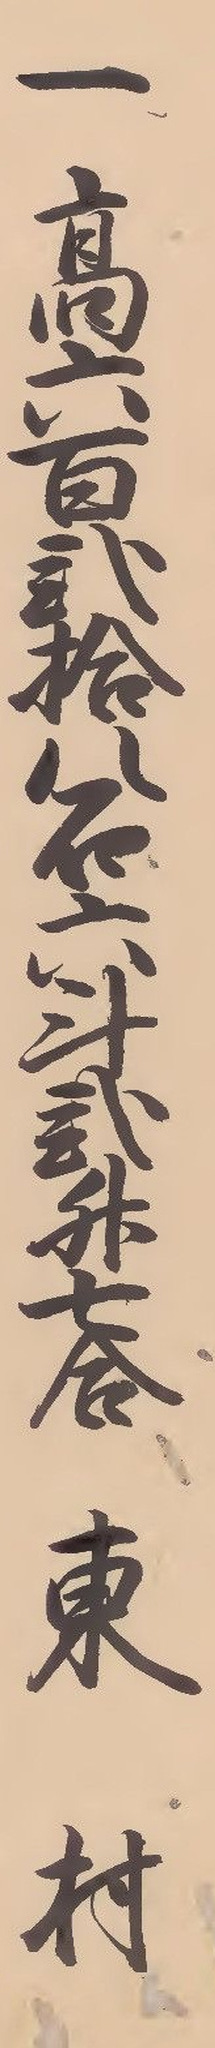一高六百弐拾八石六斗弐升七合東村
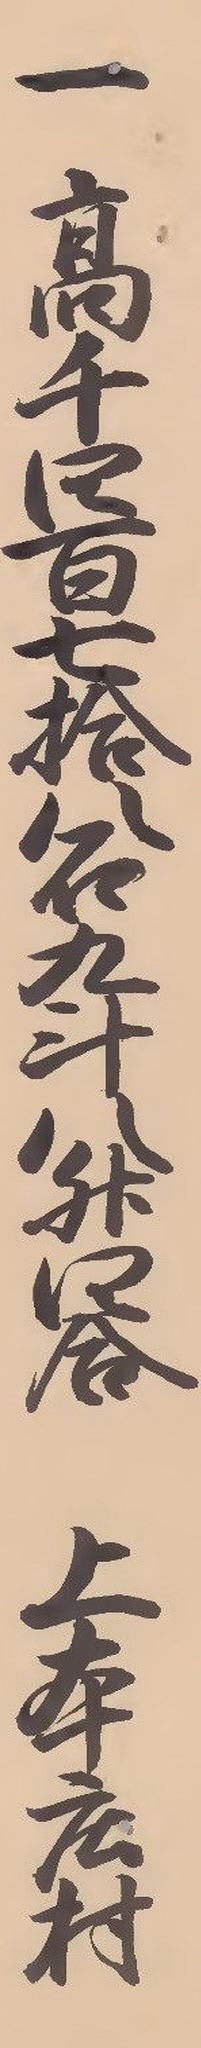一高千四百七拾八石九斗八升四合上本庄村
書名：淡路国郷帳
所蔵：国立公文書館 National Archives of Japan
